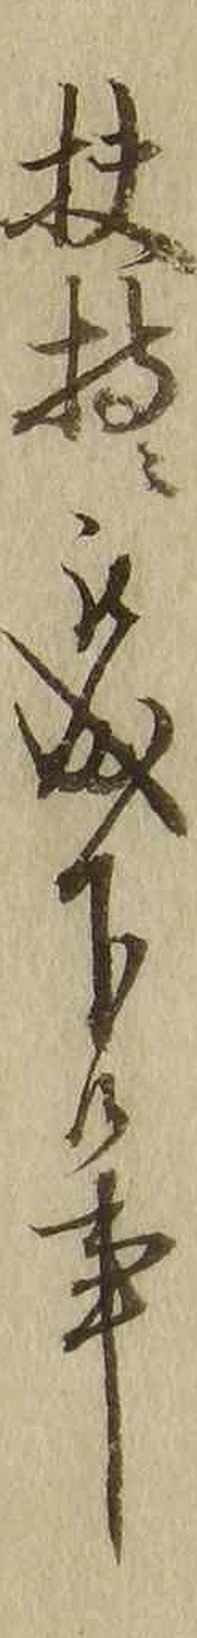扶持ニ被成下候事
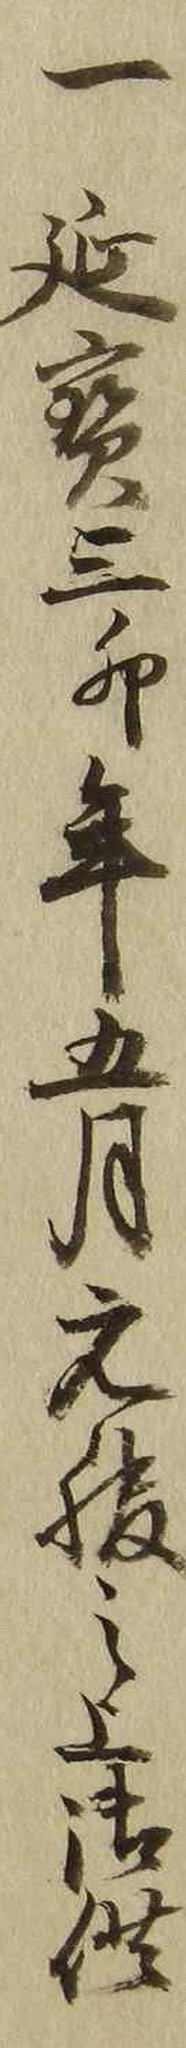一延宝三卯年五月元服之上御供
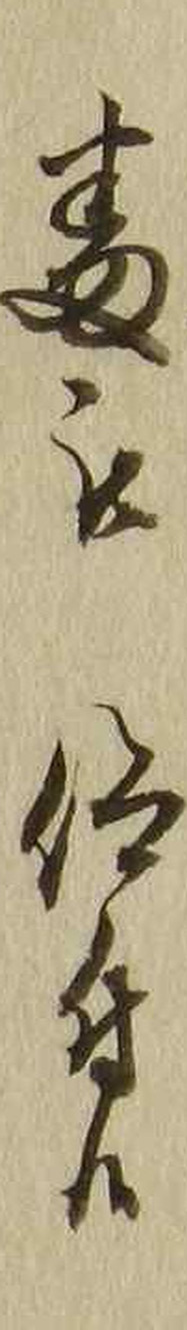番被仰付候
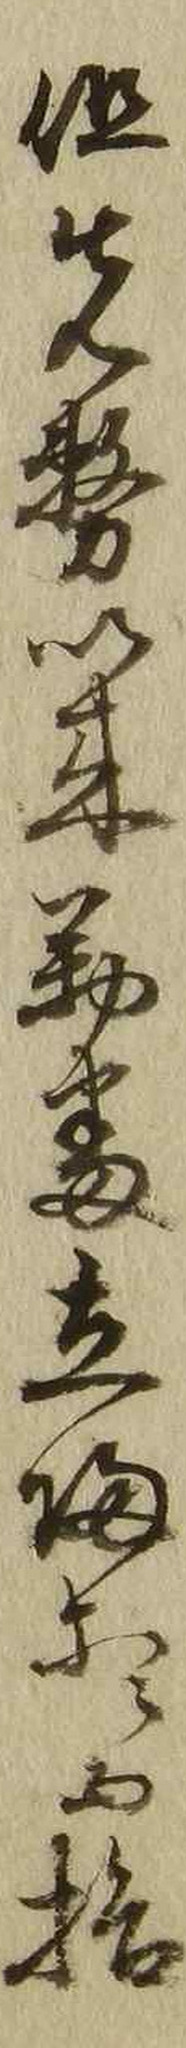但先努以来勤番立帰等ニ而拾
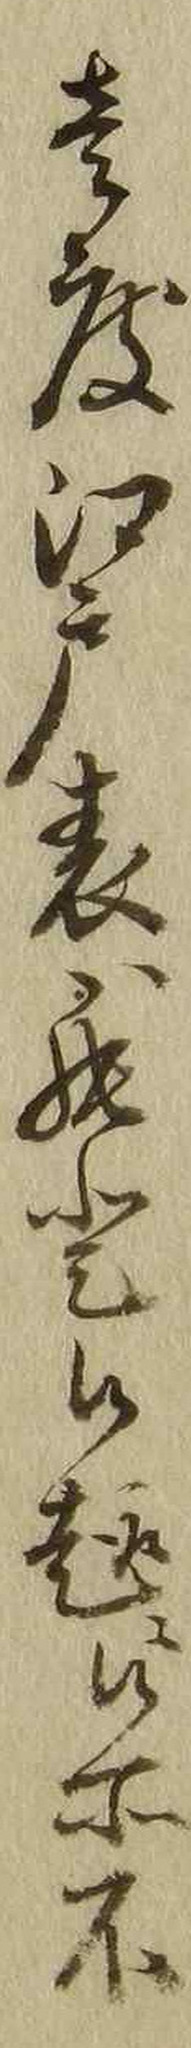壱度江戸表江罷登候趣ニ候所不
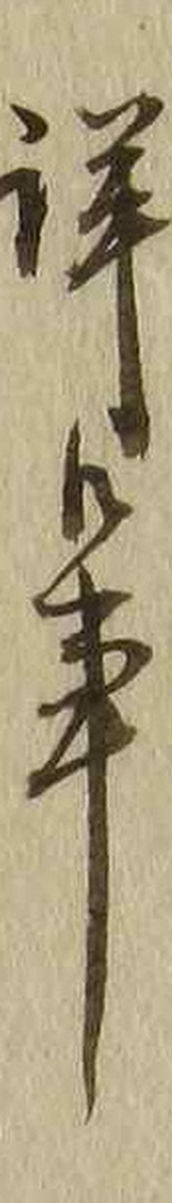詳候事
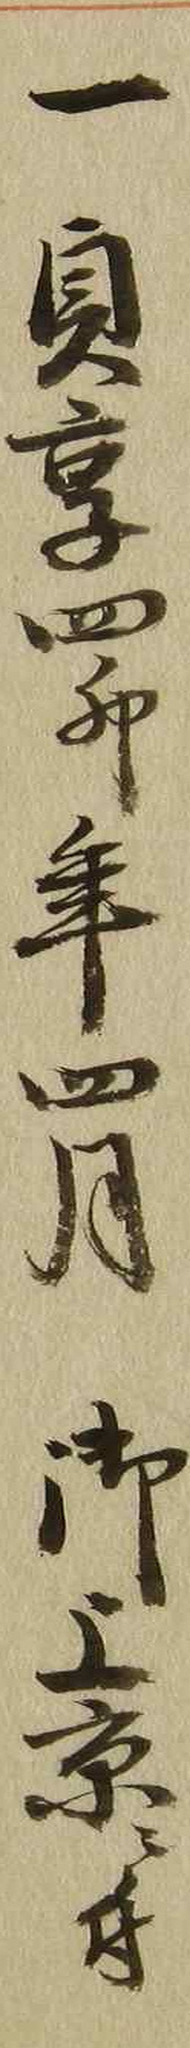一貞享四卯年四月御上京ニ付
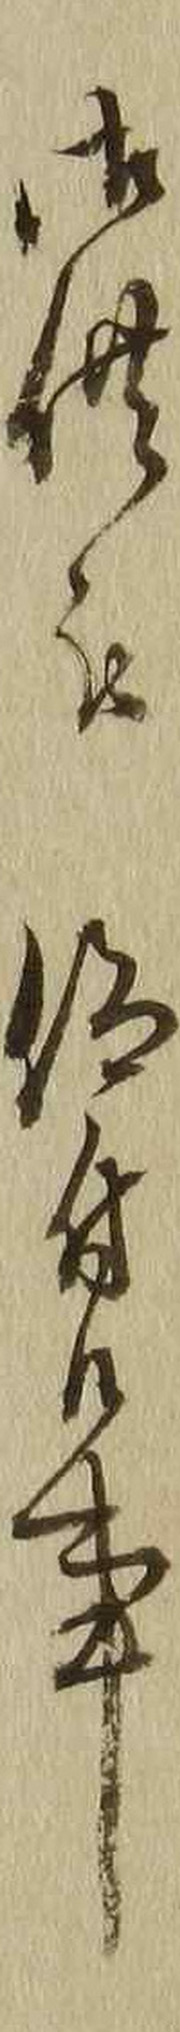御供被仰付候事
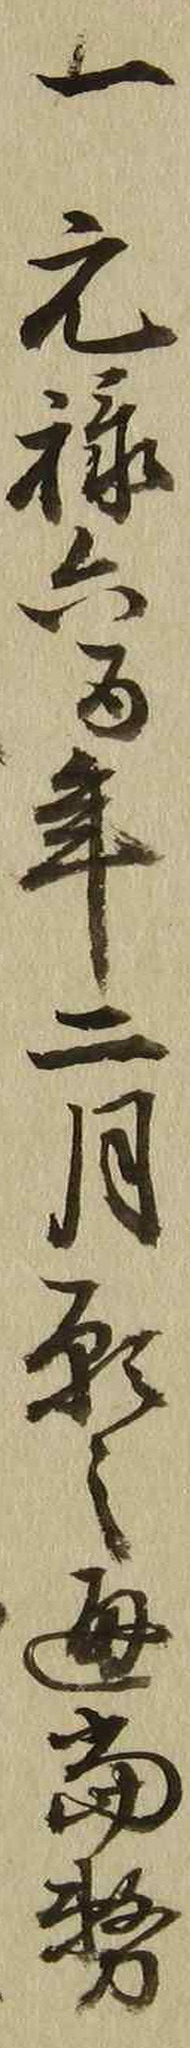一元禄六酉年二月願之通当務
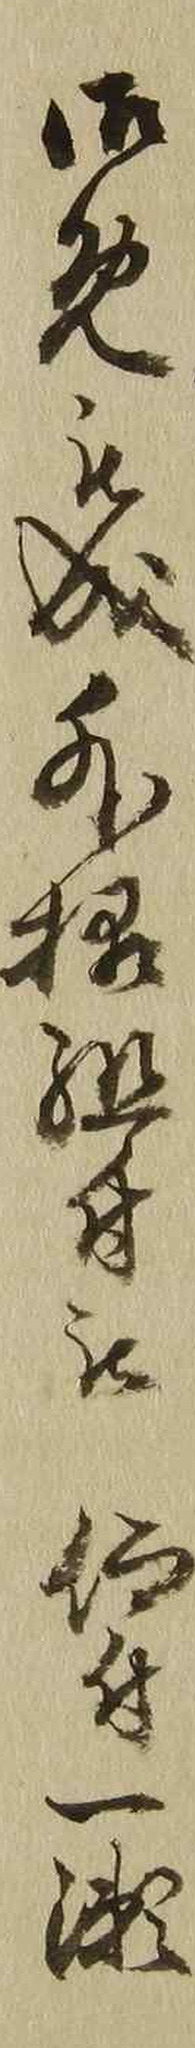御免被成外様組付被仰付一瀬
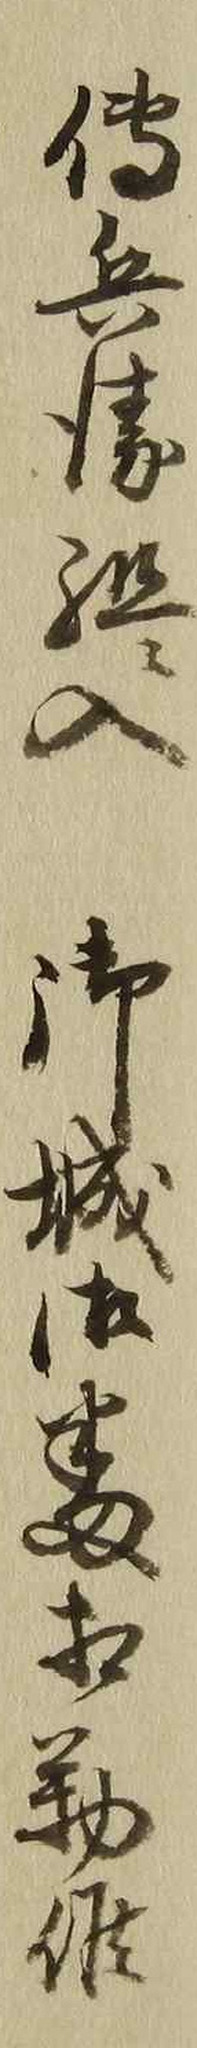伝兵衛組ニ入御城御番相勤候
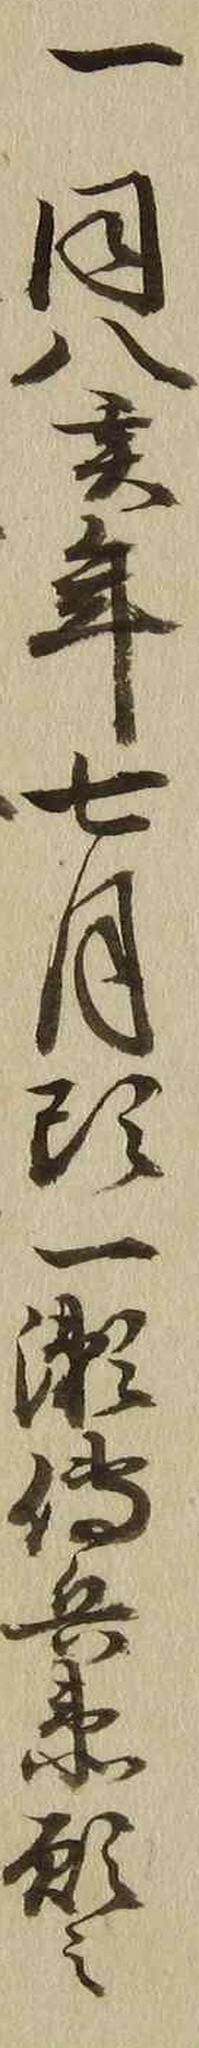一同八亥年七月頭一瀬伝兵衛願之
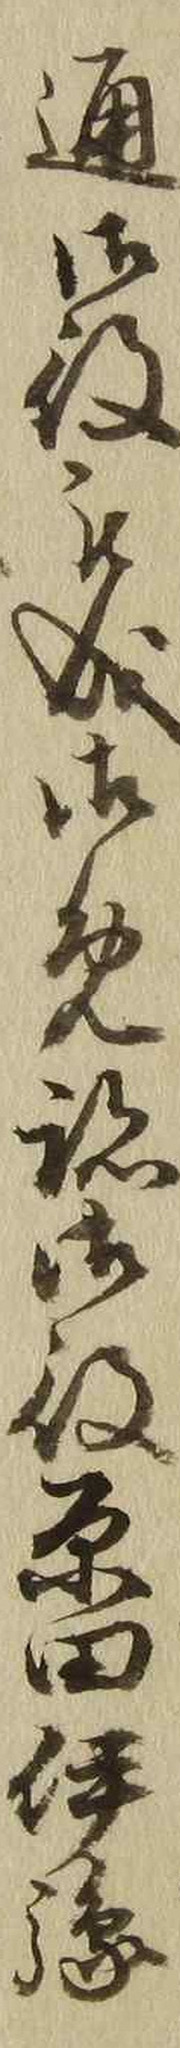通御役被成御免諸御役原田伊予
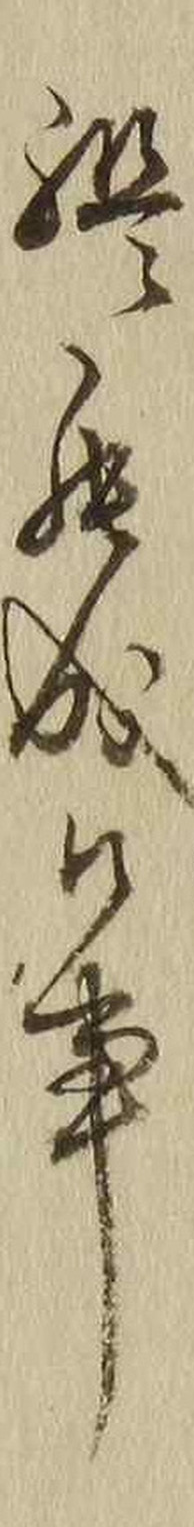組ニ罷成候事
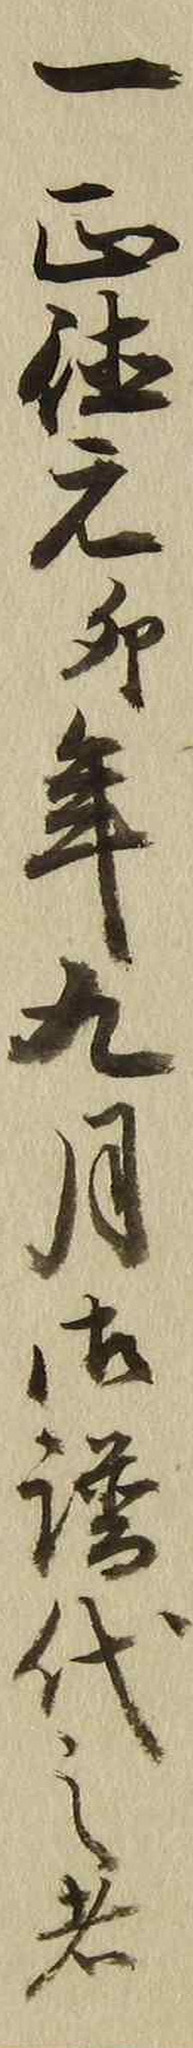一正徳元卯年九月御譜代之者
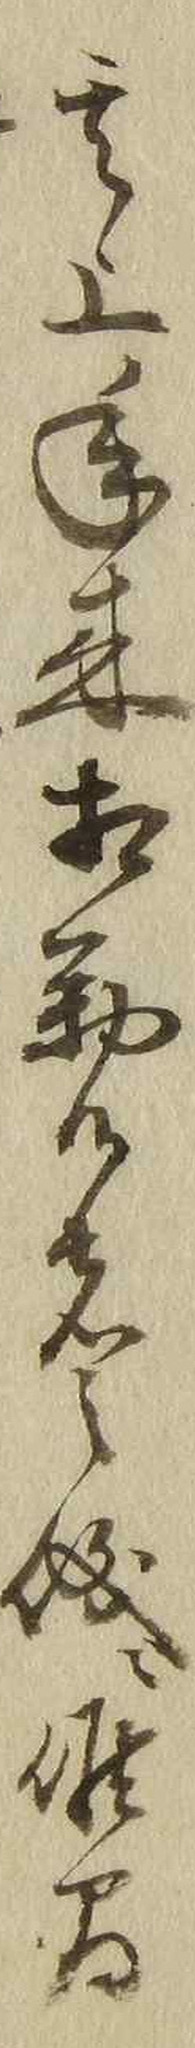其上年来相勤候者之儀ニ候間
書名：諸士系譜　巻之64　と之部7
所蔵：会津若松市立会津図書館
